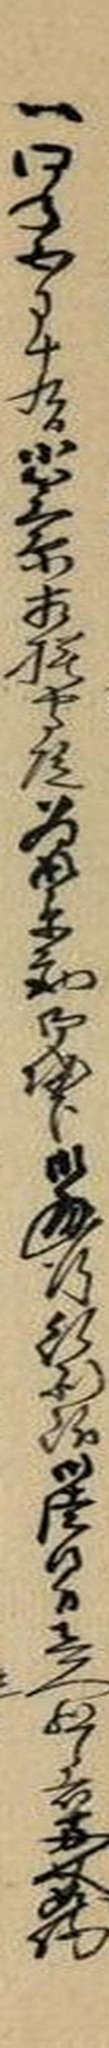一同年五月十九日小笠原相模守殿為御参勤御城下御通行行列附御徒目付壱人組之者両人如例
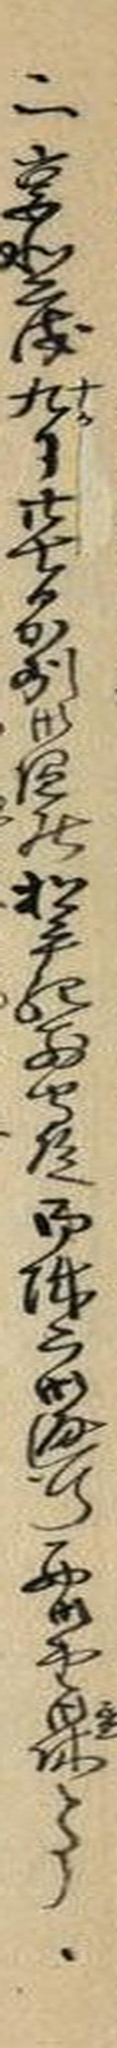・一享和二戌九月廿七日加州御隠居松平肥前守殿御城下御通行西御堂御昼休候事
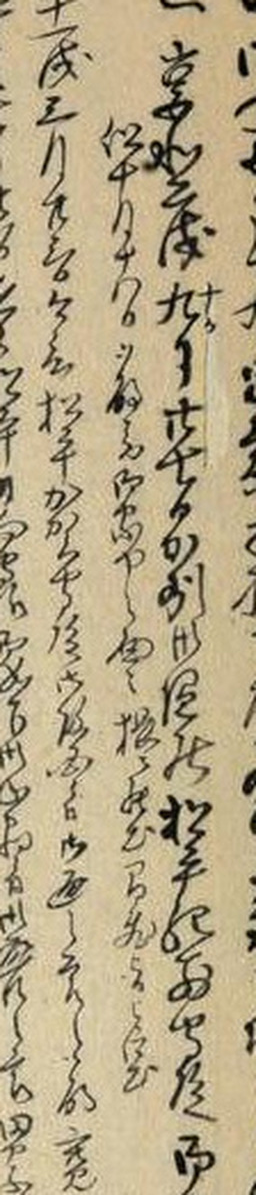但十月十八日夕触ニ而御家中之面々猥ニ罷出間敷旨被仰出
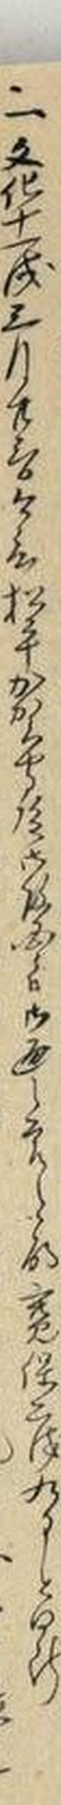・一文化十一戌三月廿三日今度松平加賀守殿御帰国ニ付御通之節之御触寛保二戌九月と同断
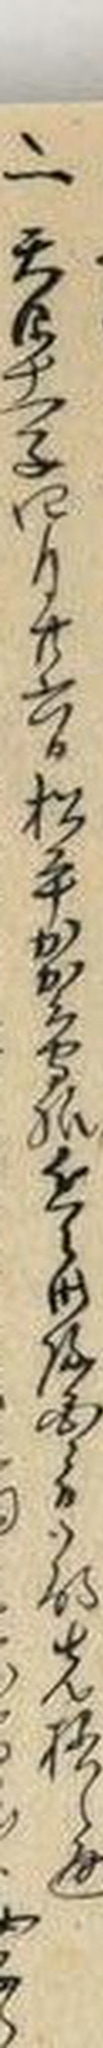・一天保十一子四月廿六日松平加賀守様近々御帰国ニ付御触先格之通
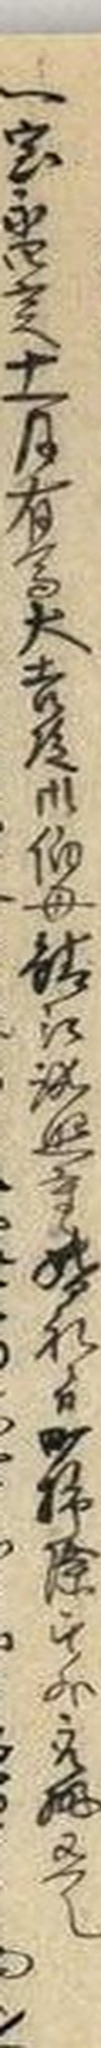一宝永四亥十一月有馬大吉殿御伯母鯖江誠照寺婚礼ニ付町掃除其外取扱有之
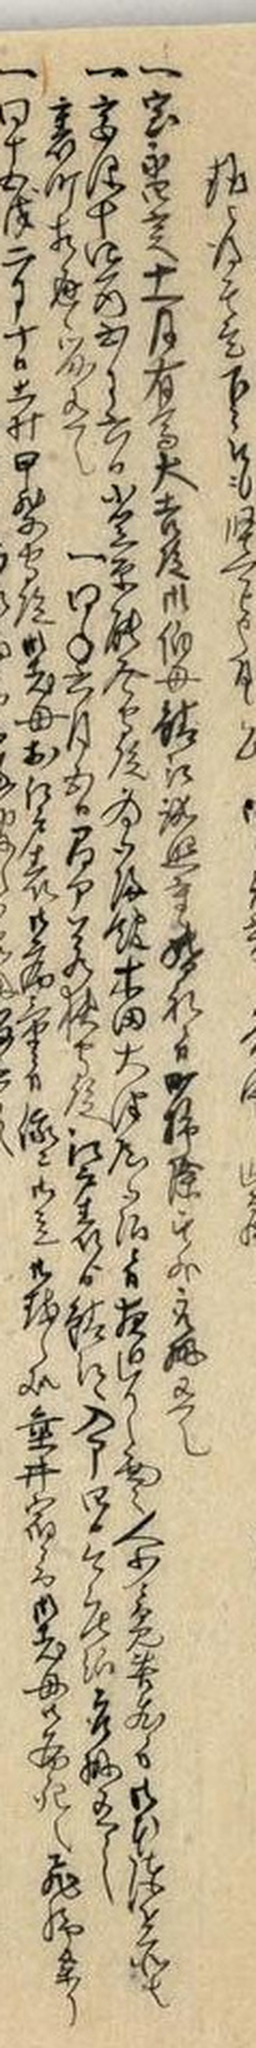一享保十四酉五月六日小笠原能登守殿為御帰館木田大津屋御泊ニ付夜廻り之面々人少ニ而見苦敷ニ付御本陣近所者
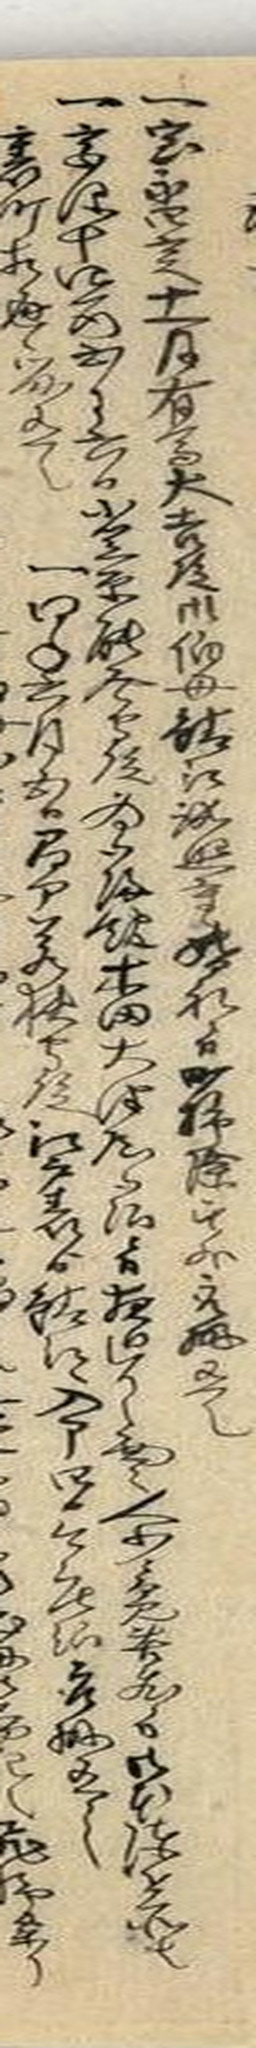裏町相通候留有之一同年六月五日間部若狭守殿江戸表ゟ鯖江へ入部四日今庄泊取扱有之
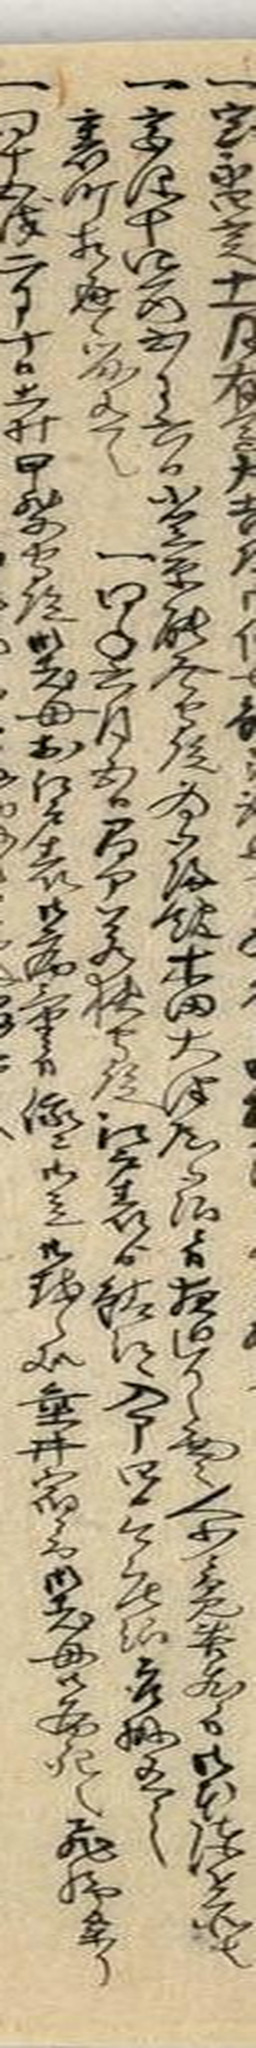一同十五戌二月十日土井甲斐守殿御老母於江戸表御病気ニ付俄ニ御立御越候処垂井宿ニ而御老母御病死之飛脚参り
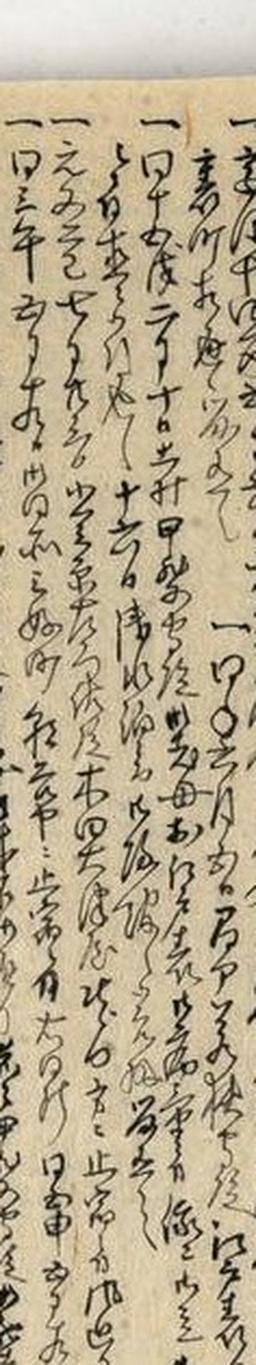候ニ付直ニ御引返候十六日浅水泊ニ而御帰館之御取扱留有之
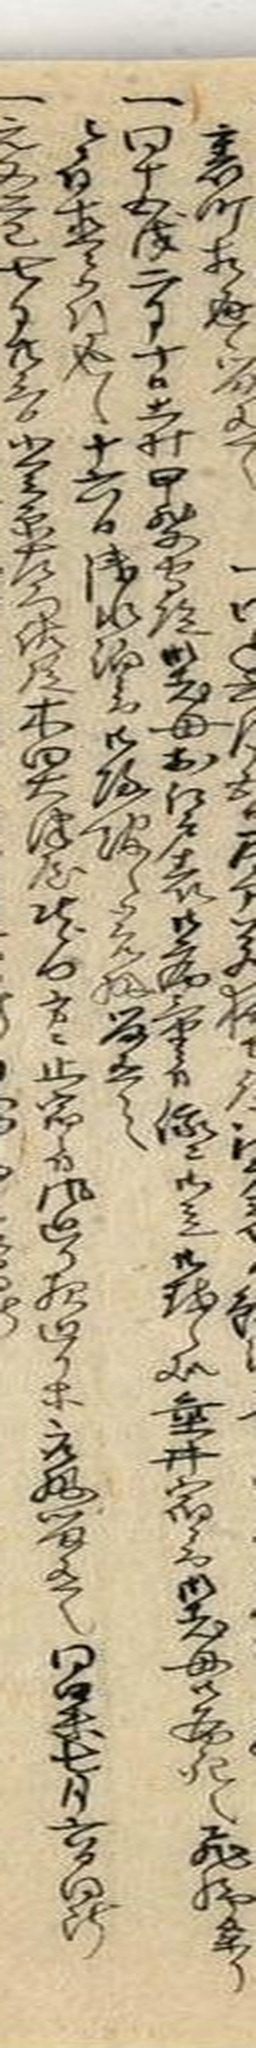一元文二巳七月廿三日小笠原左衛門佐殿木田御大津屋次郎右衛門方ニ止宿ニ付風廻り夜廻り等取扱留有之同四未七月六日同断
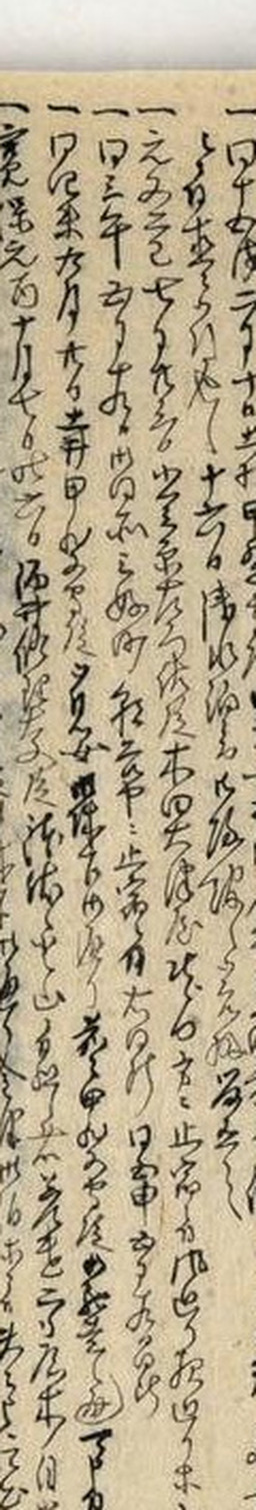一同三午五月十九日御同所三好町朝谷やニ止宿ニ付右同断同五申五月十九日同断
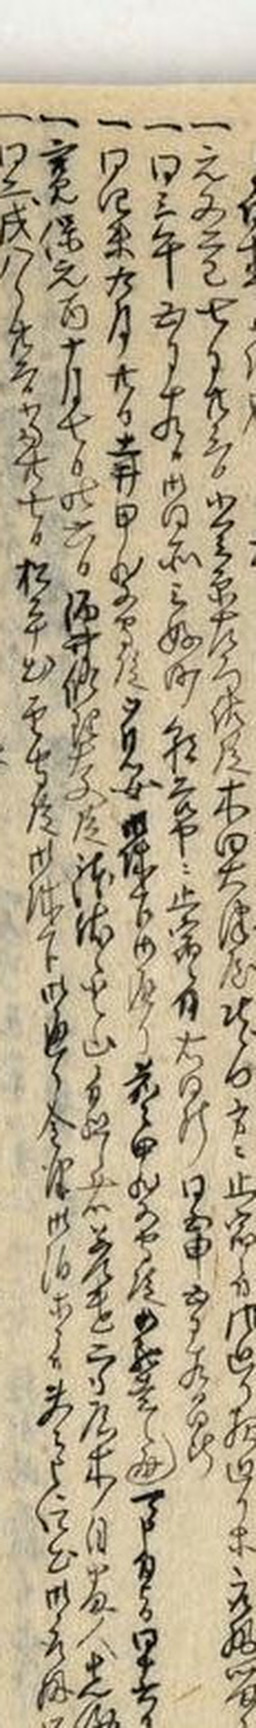一同四未九月廿日土井甲斐守殿御息女御城下御通り前々甲斐守殿御馳走之通可申付旨同十六日御家老中差図
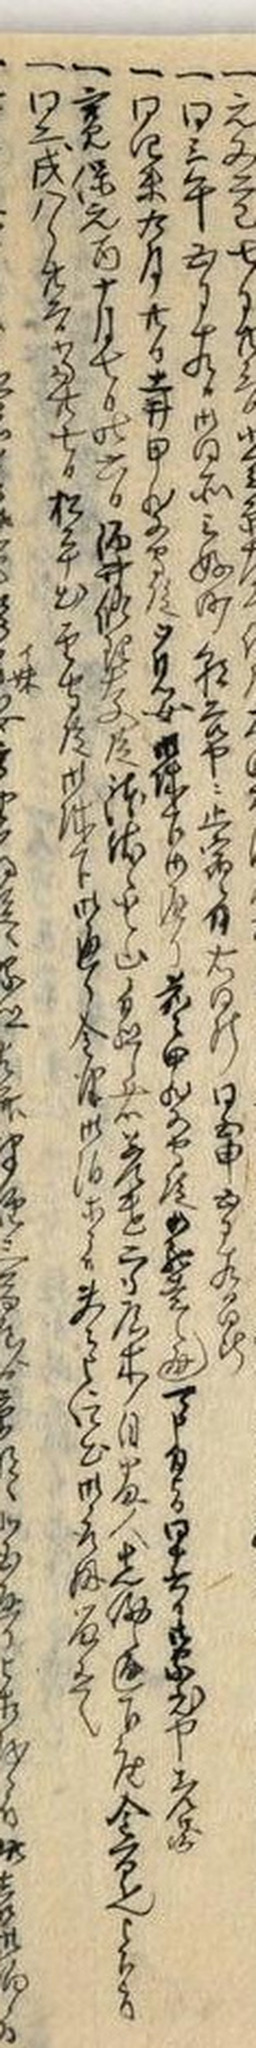一寛保元酉十月七日昨六日酒井修理太夫殿鉢伏へ登山ニ付組之者差遣二ツ屋木ノ目番人先例之通下座金百疋被下旨
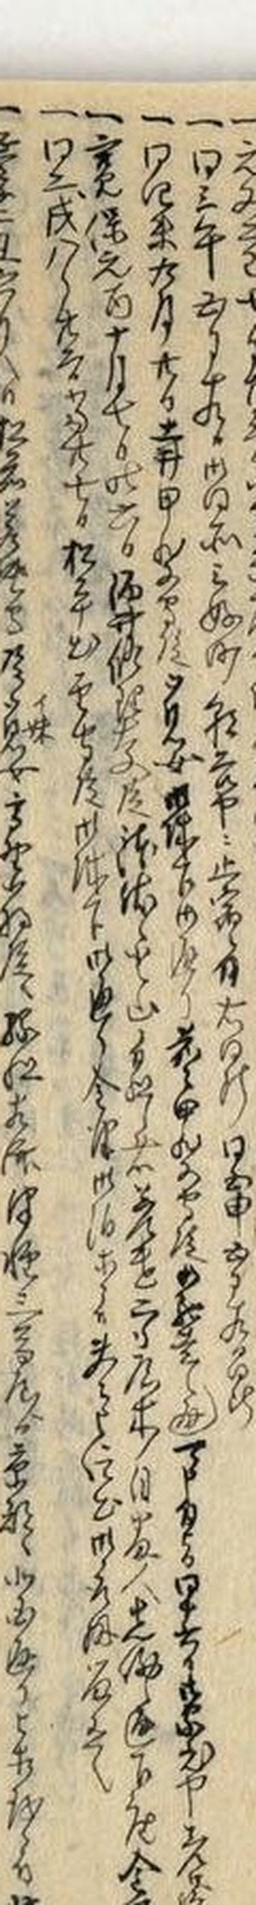一寛保元酉十月七日昨六日酒井修理太夫殿鉢伏へ登山ニ付組之者差遣二ツ屋木ノ目番人先例之通下座金百疋被下旨
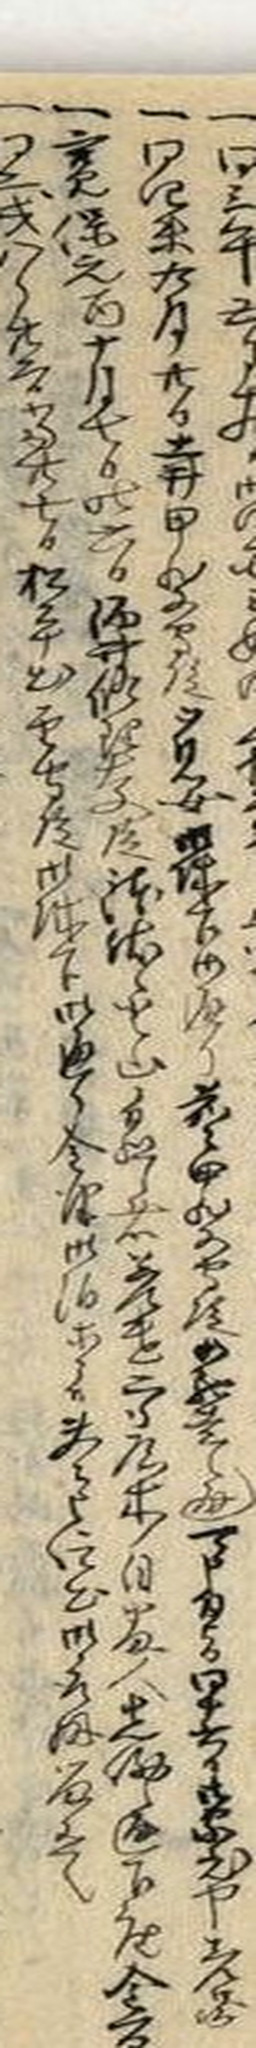一同二戌八月廿二日当廿七日松平出雲守殿御城下御通り金津御泊等ニ付夫々被仰出御取扱留有之
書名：御国他国諸事之部
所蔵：福井県文書館 Fukui Prefectural Archives
